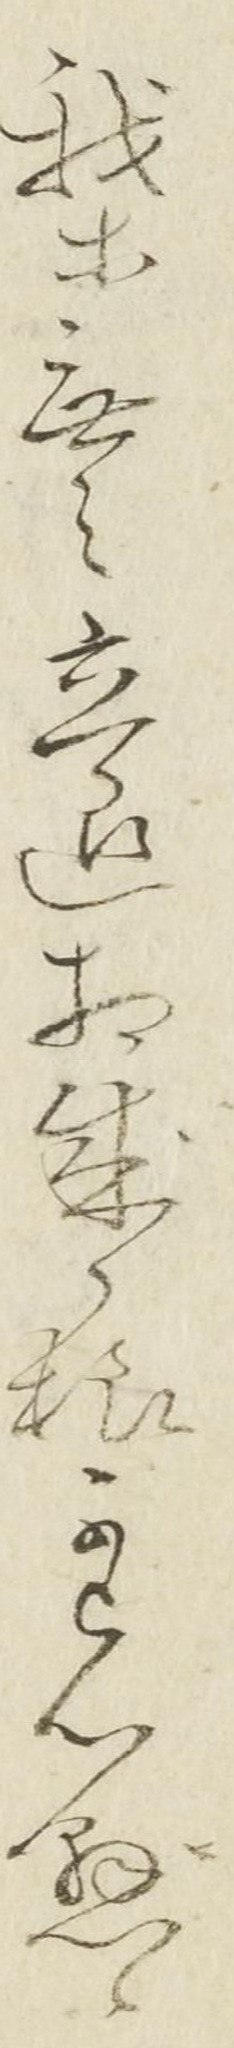我等無之立退相成候様可被心懸候
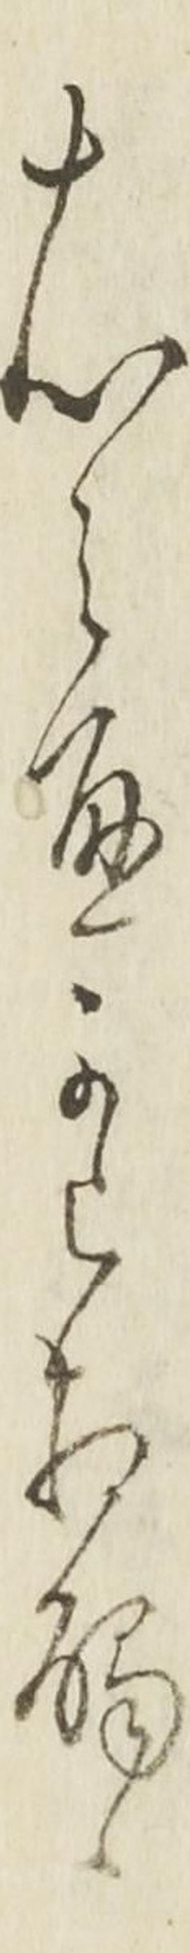右之通可被相触候
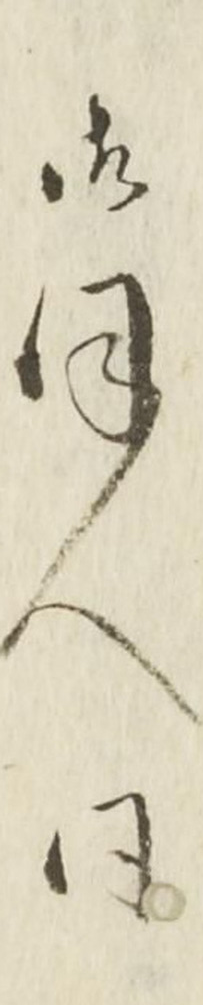御同人同
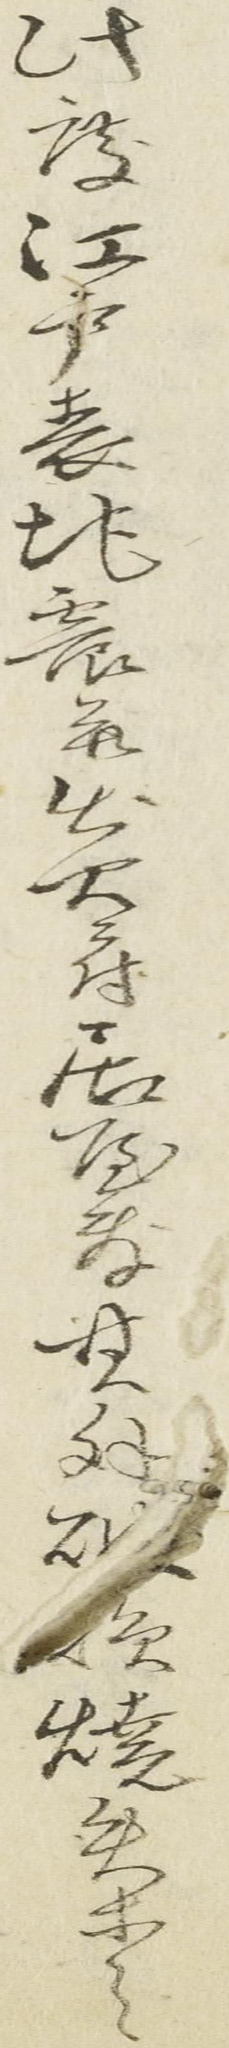此度江戸表地震并出火ニ付居屋敷其外破損焼失等之
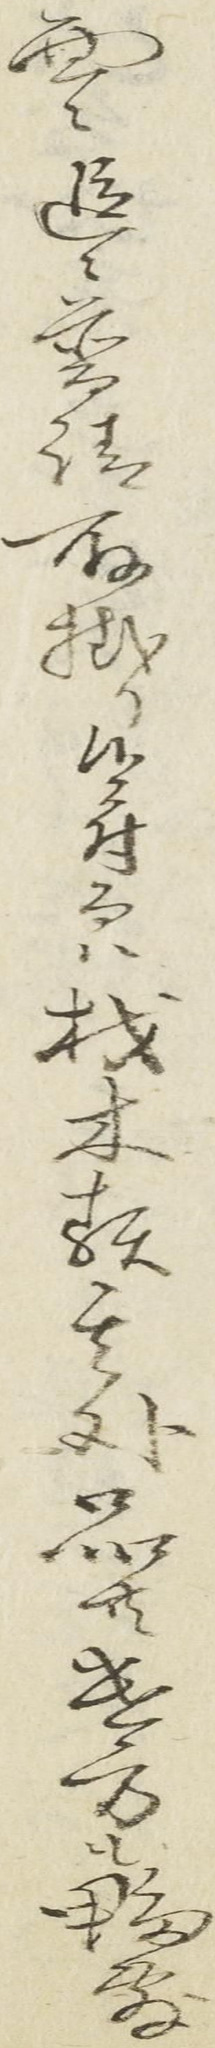面々追々普請取掛り候ニ付而ハ材木類其外品共遣方も夥敷
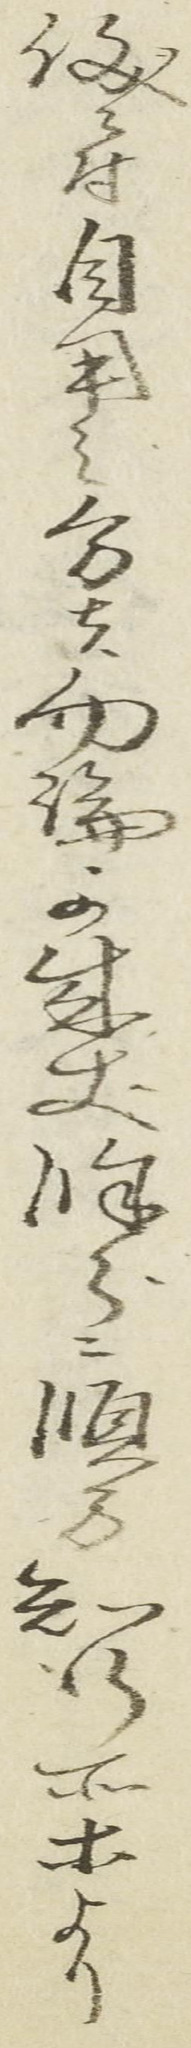儀ニ付自用之分は勿論可成丈餘分ニ領分知行所等より
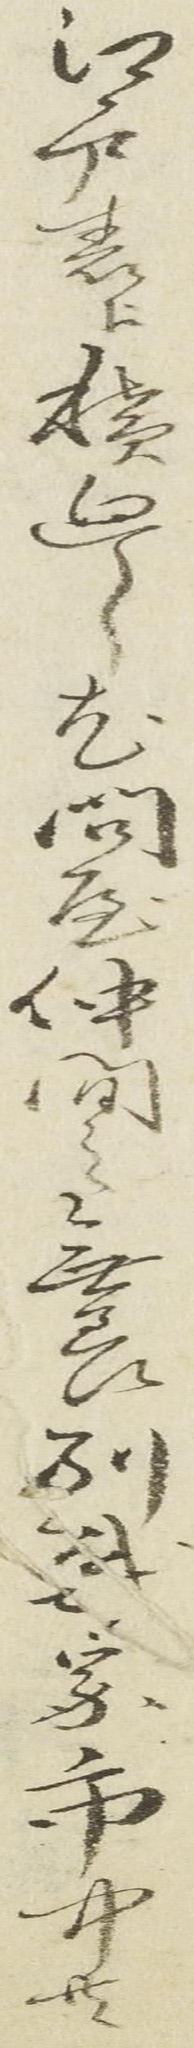江戸表え積廻し尤問屋仲間之無差別武家市中共
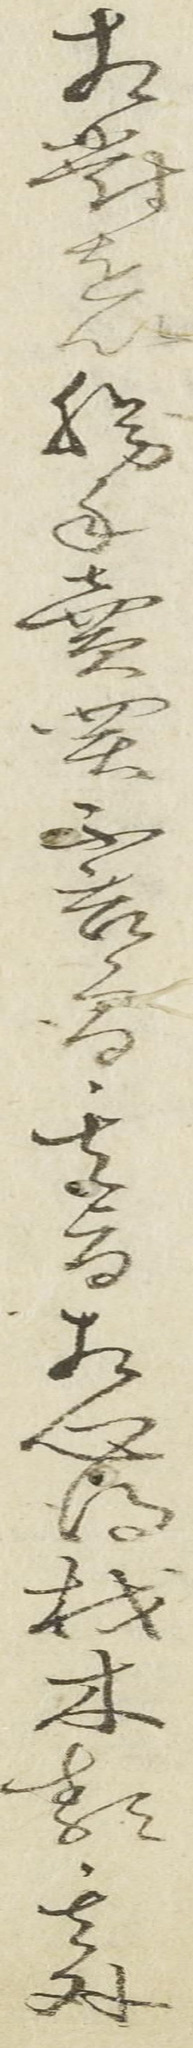相対を以勝手売買不苦候間其旨相心得材木類其外
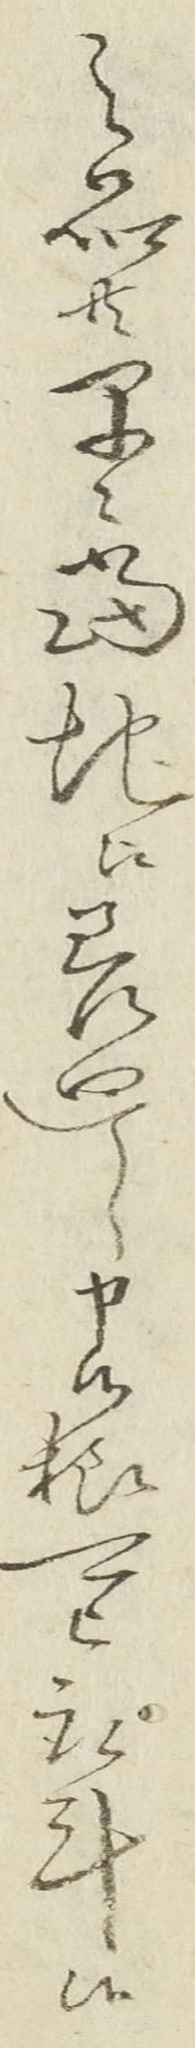之品共早々当地え差廻し申候様可被取斗候
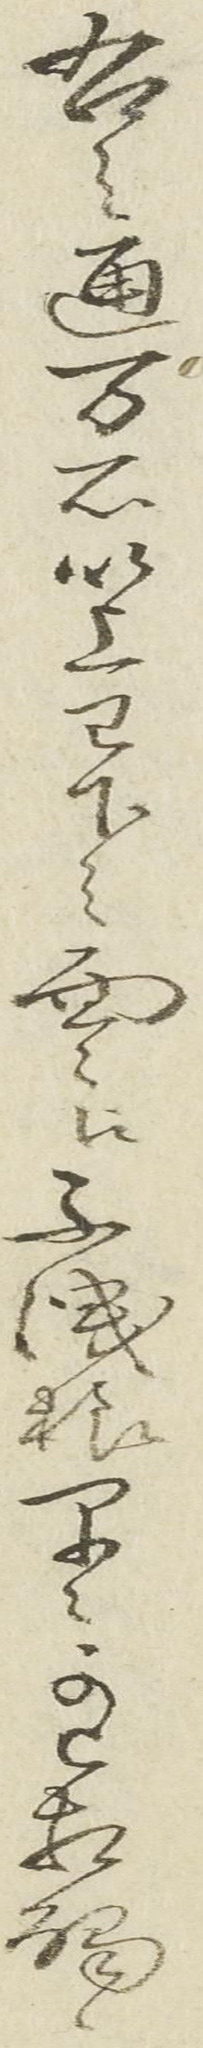右之通万石以上已下之面々え不洩様早々可被相触候
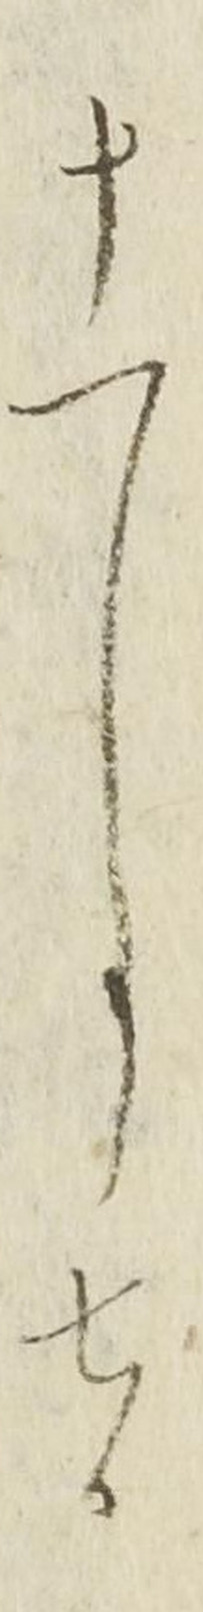十一月七日
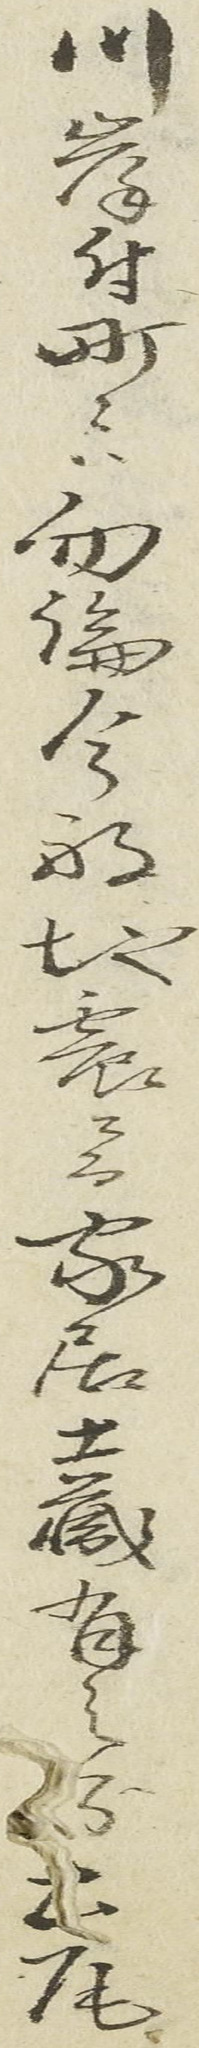川岸付町々ハ勿論今般地震ニ而家居土蔵有之分土瓦
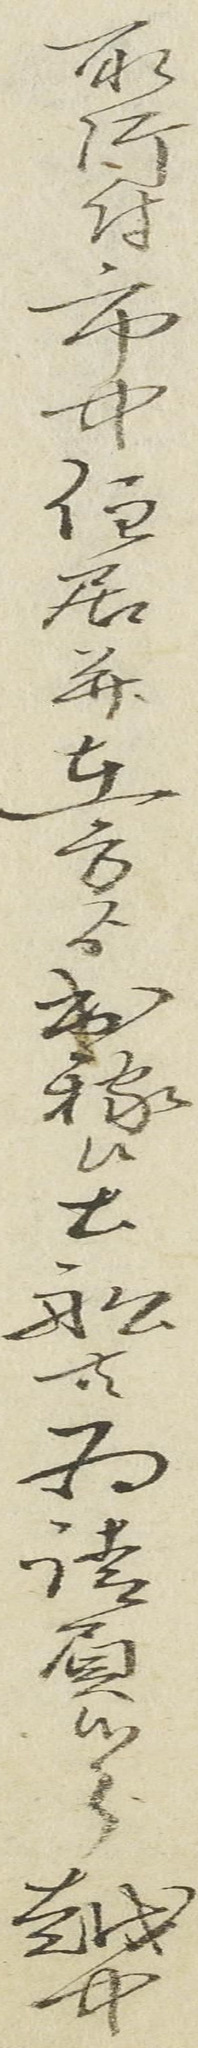取片付市中住居并在方ゟ出稼候土舩共為請負候分越中
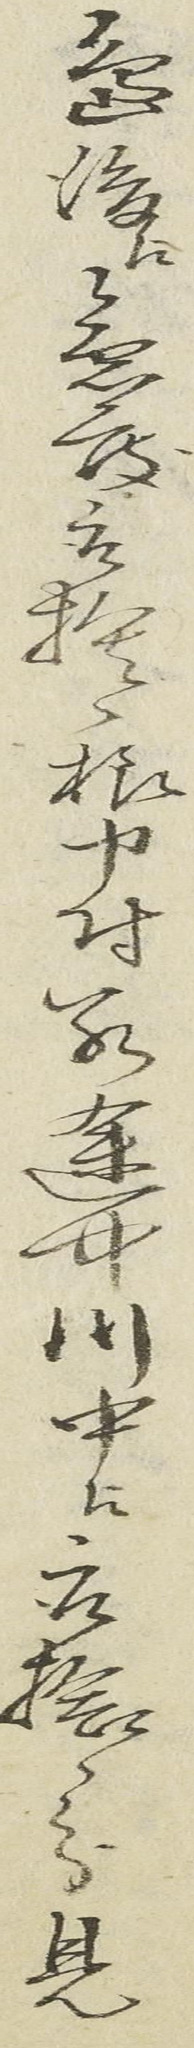島後え急度取捨候様申付若途中川中え取捨候分見
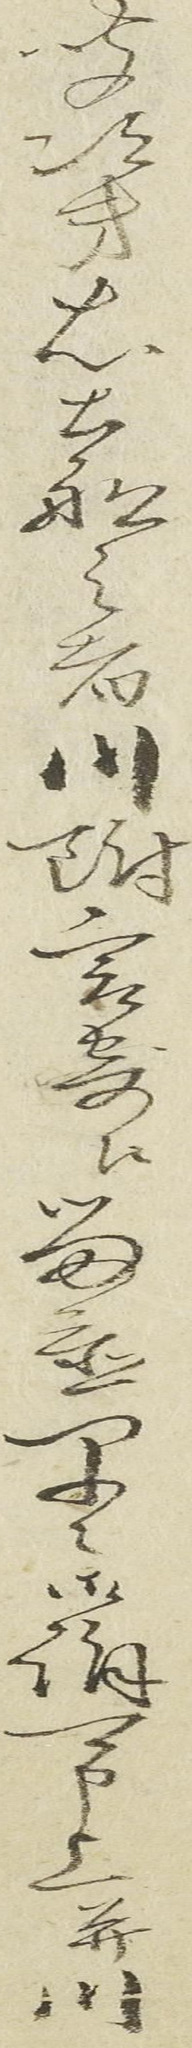聞次第右土舩之者川附最寄え留置早々御訴可申上并川
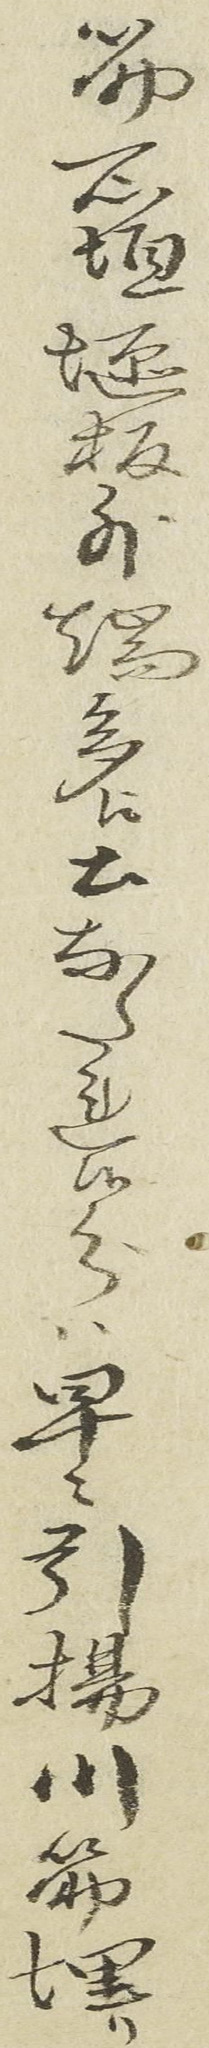筋石垣堰板外端多え土なたれ候分ハ早々引揚川筋埋り
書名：安政二乙卯年十月二日大地震之事
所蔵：東京大学地震研究所図書室 Earthquake Research Institute Library, The University of Tokyo, JAPAN
